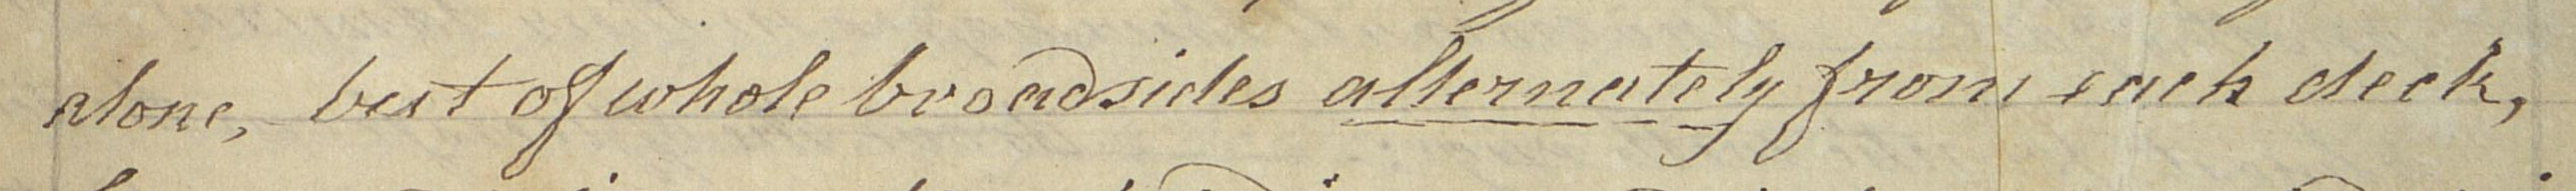alone, but of whole broadsides alternately from each deck,
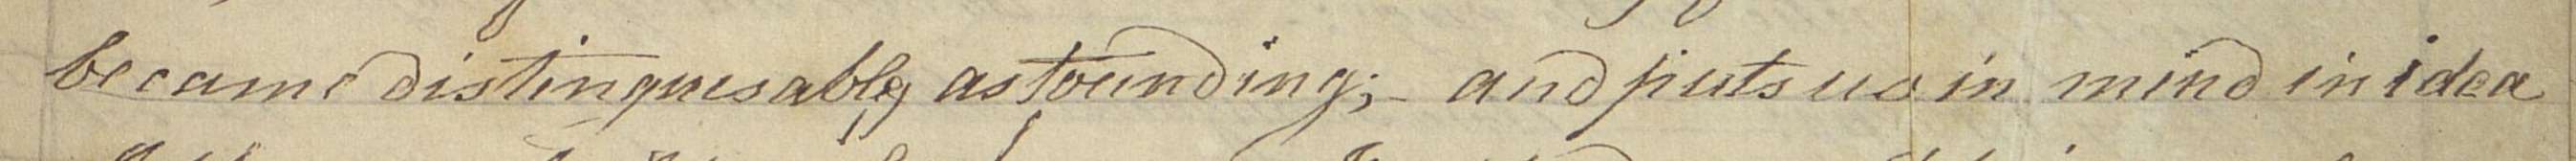became distinguesably astounding; and puts us in mind in idea
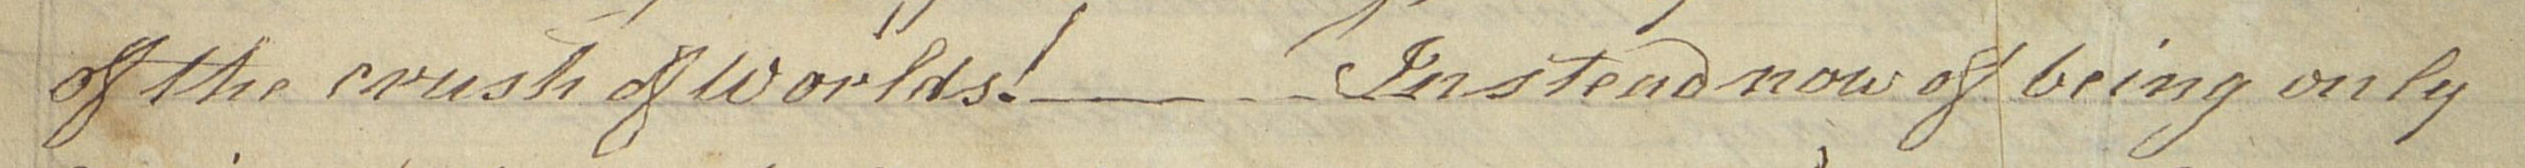of the crush of Worlds! Instead now of being only
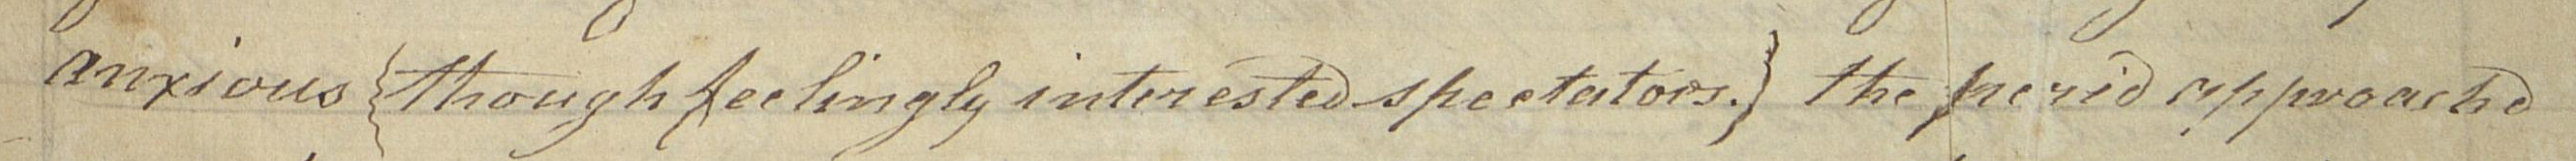anxious (though feelingly interested spectators.) the pered approachd
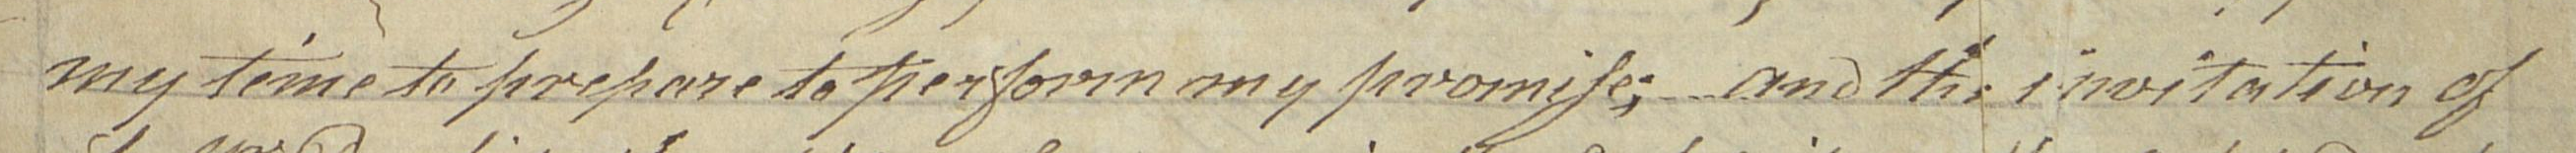my time to prepare to perform my promise; and the invitation of
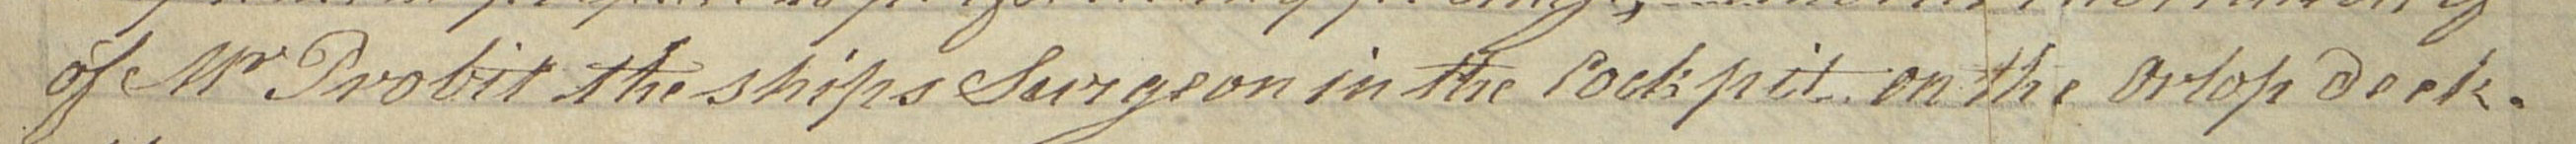of M^r. Probit the ships Surgeon in the cockpit on the Orlop deck.
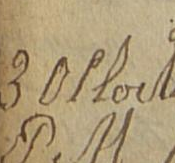3 OClock
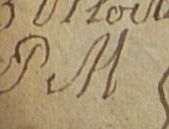PM
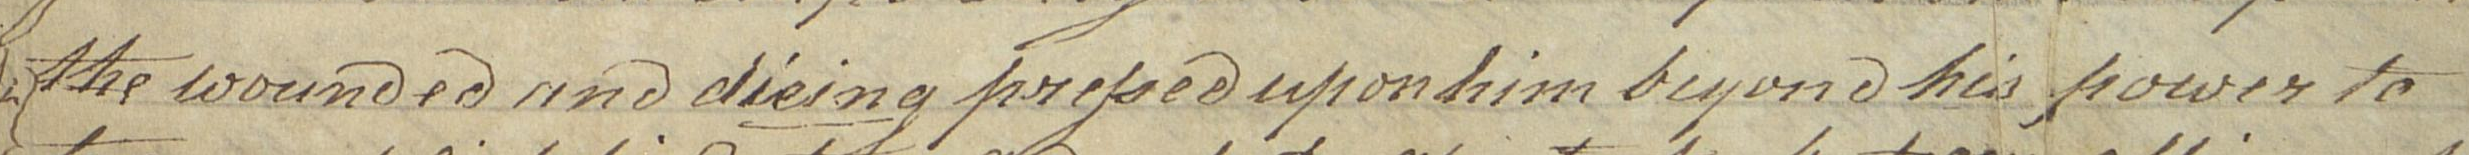the wounded and dieing pressed upon him beyond his power to
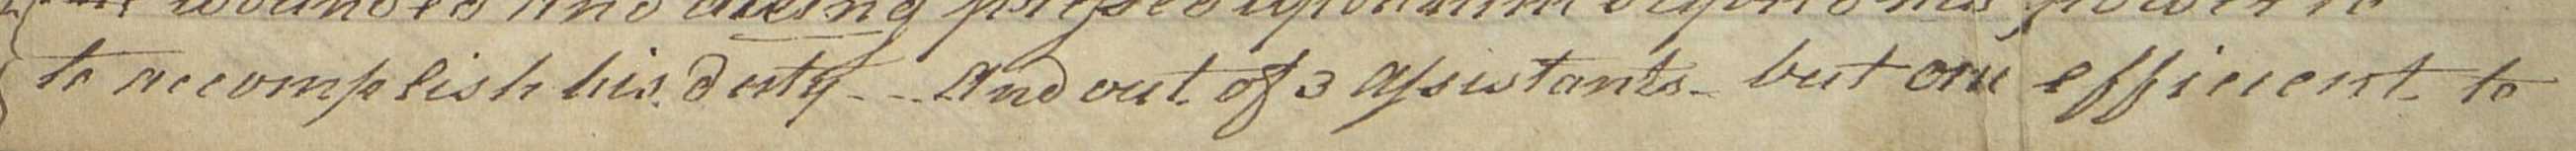to accomplish his duty And out of 3 assistants, but one efficient to
